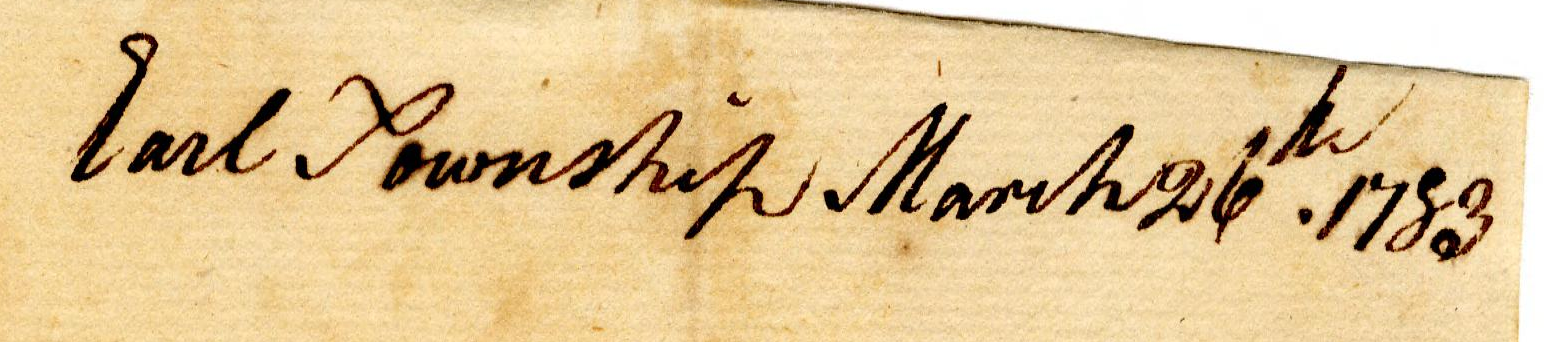Earl Township March 26^th 1783
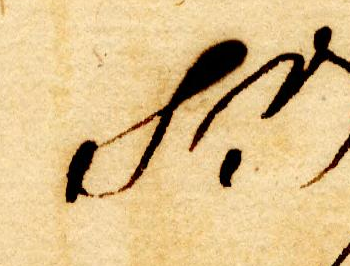S^r.
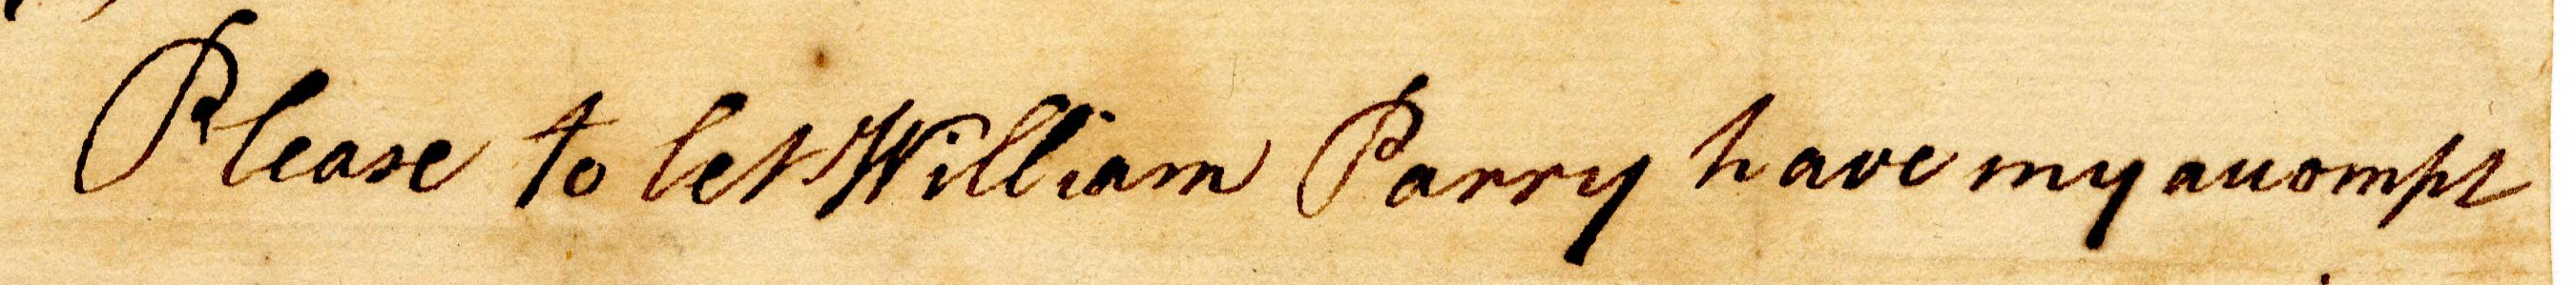Please to let William Parry have my accompt
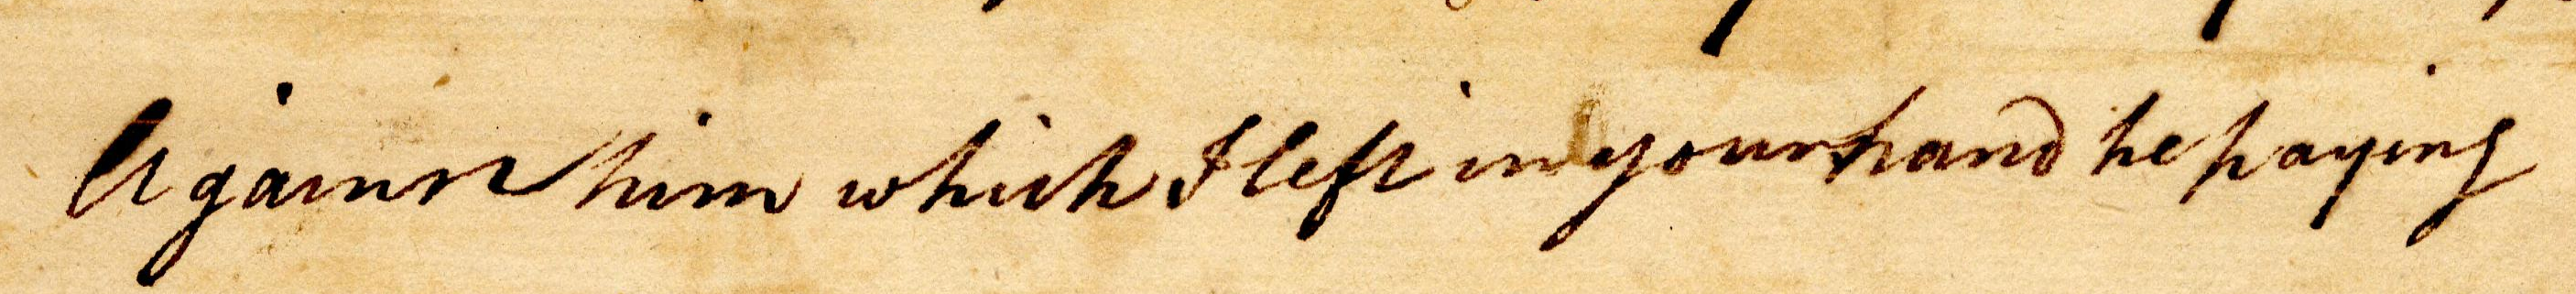Against him which I left in your hand he paying
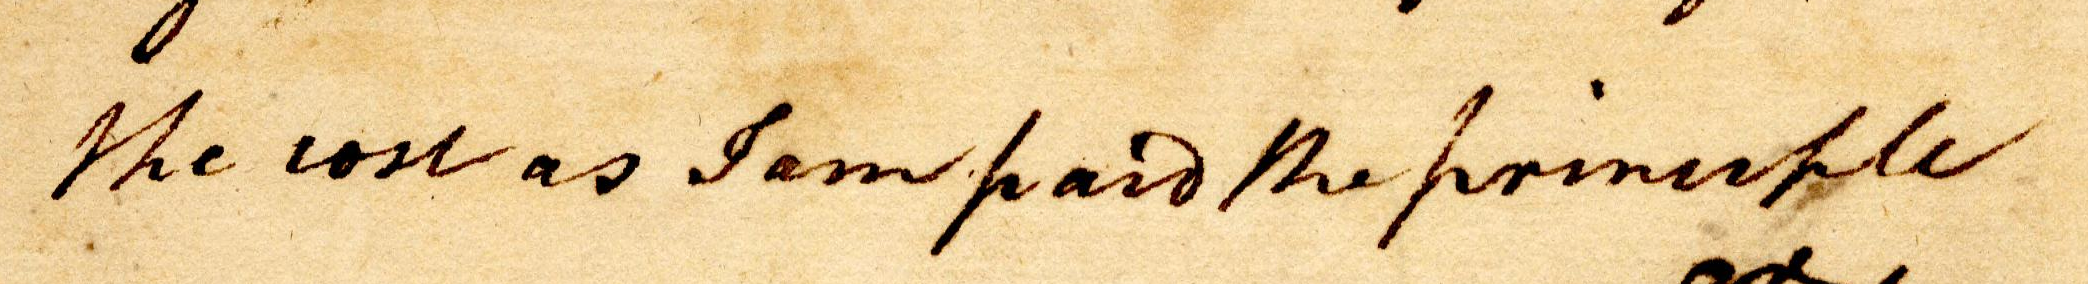the cost I am pard the principle
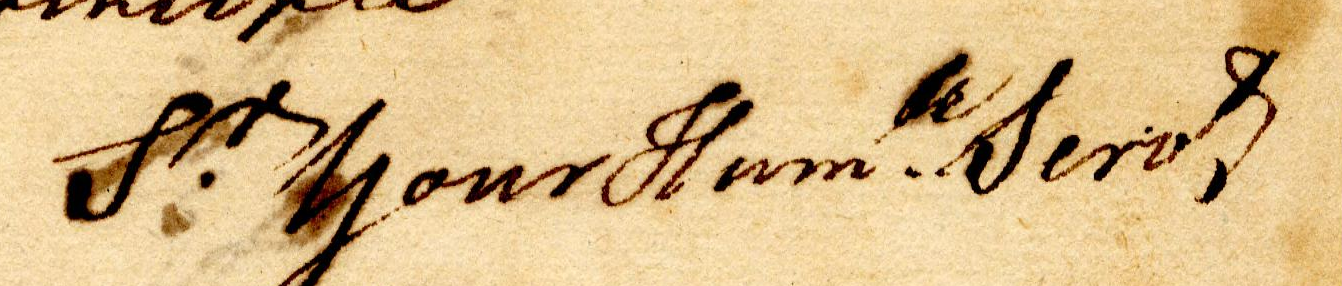S^r. Your Hum^ble. Serv^t.
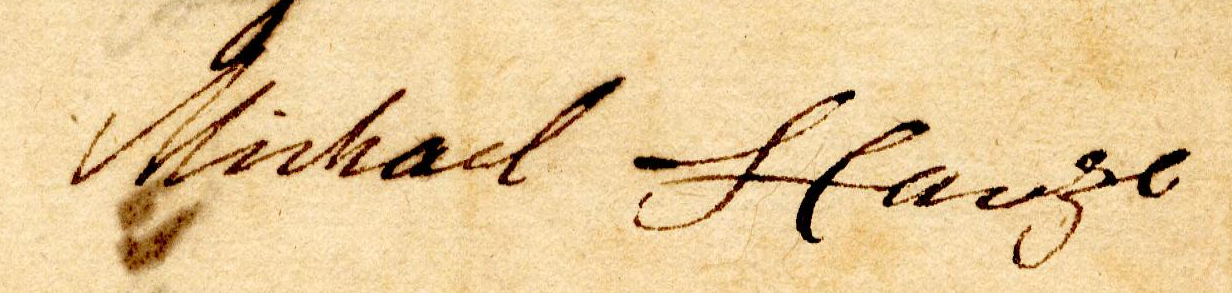Michael Hazel
